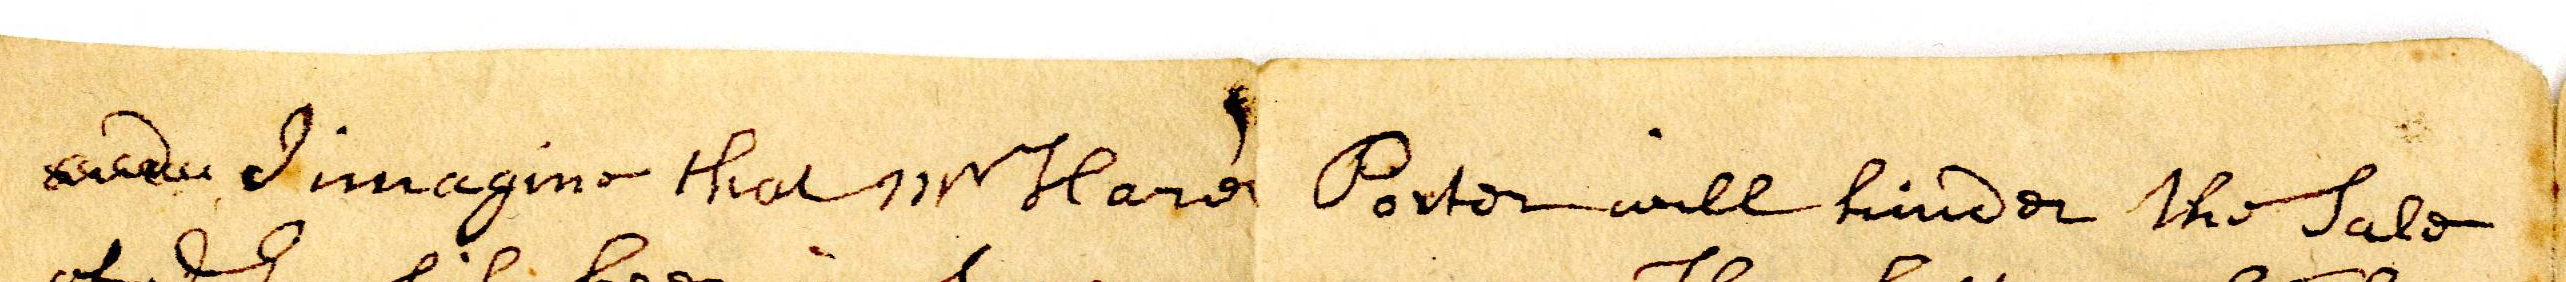[___] I imagine that M^r Harol Porter will hinder the sale
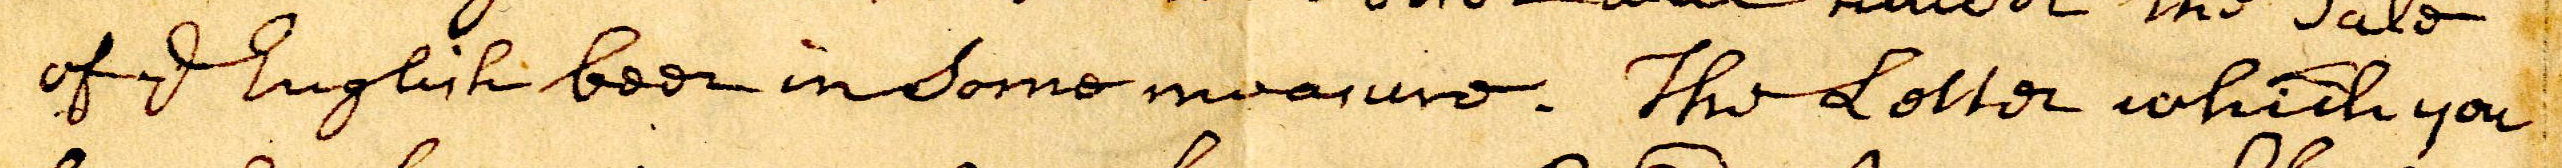of y^e English beer in some measure. The Letter which you
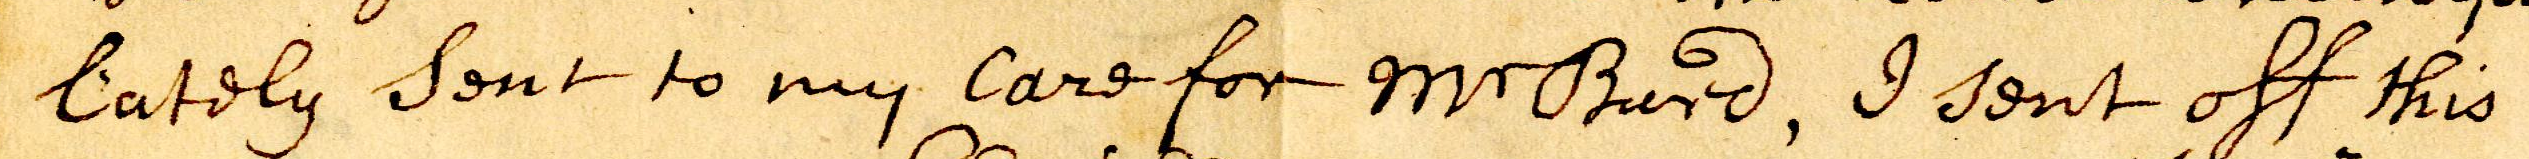lately sent to my Care for M^r Burd, I sent off this
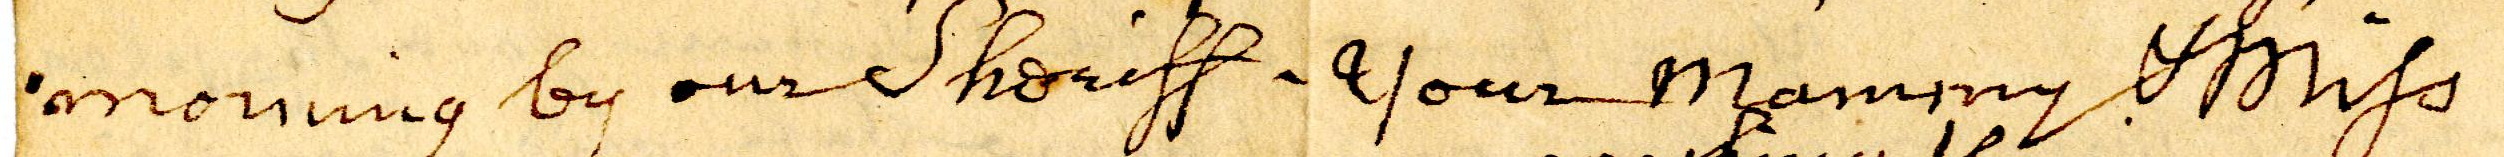morning by our Sheriff- Your Mammy & Miss
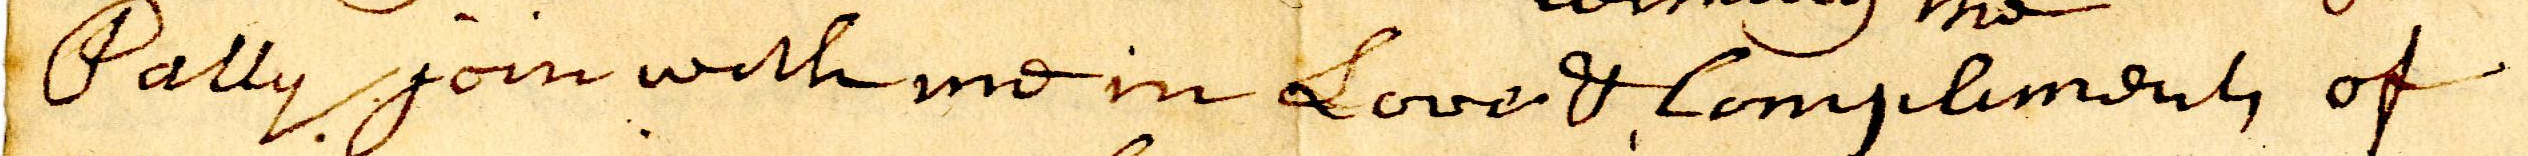Patty join with me in Love & Compliments of
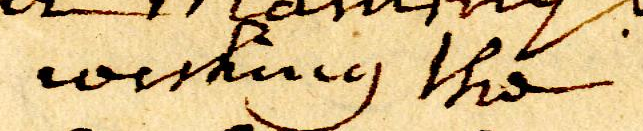wishing the
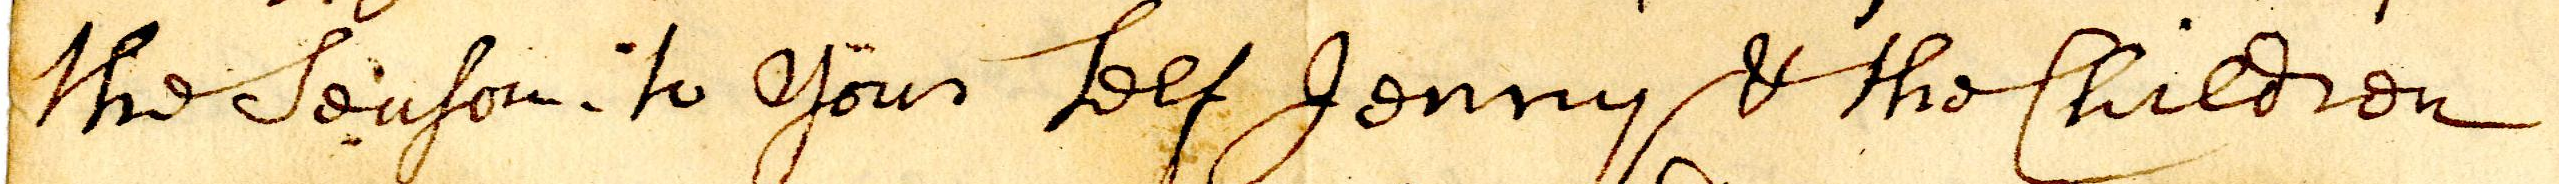the Season. to Your Self Jenny & the Children
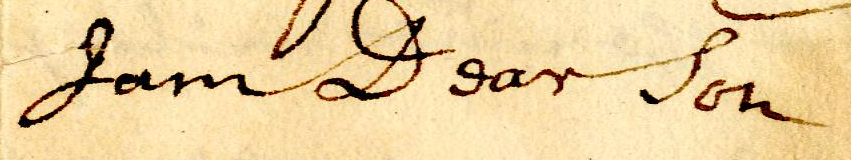I am Dear Son
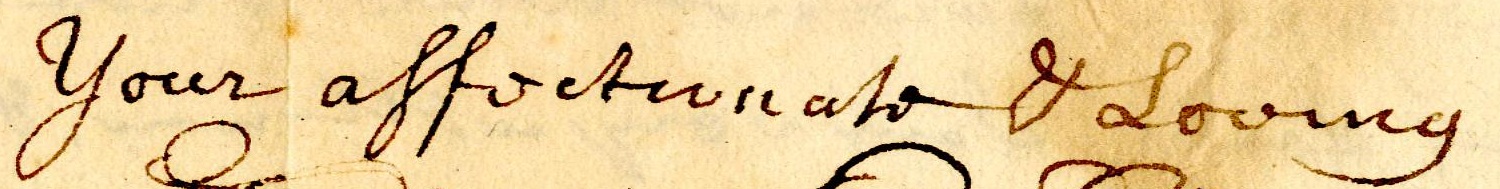Your affectionate & Loving
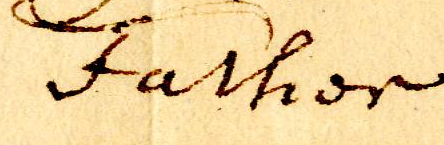Father
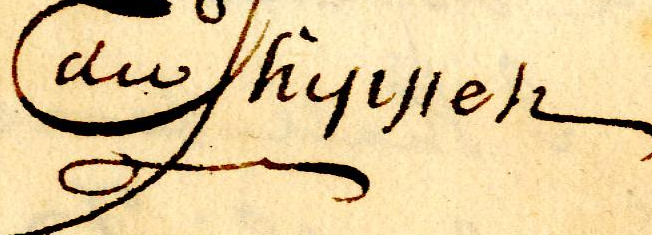Edw^d Shippen
